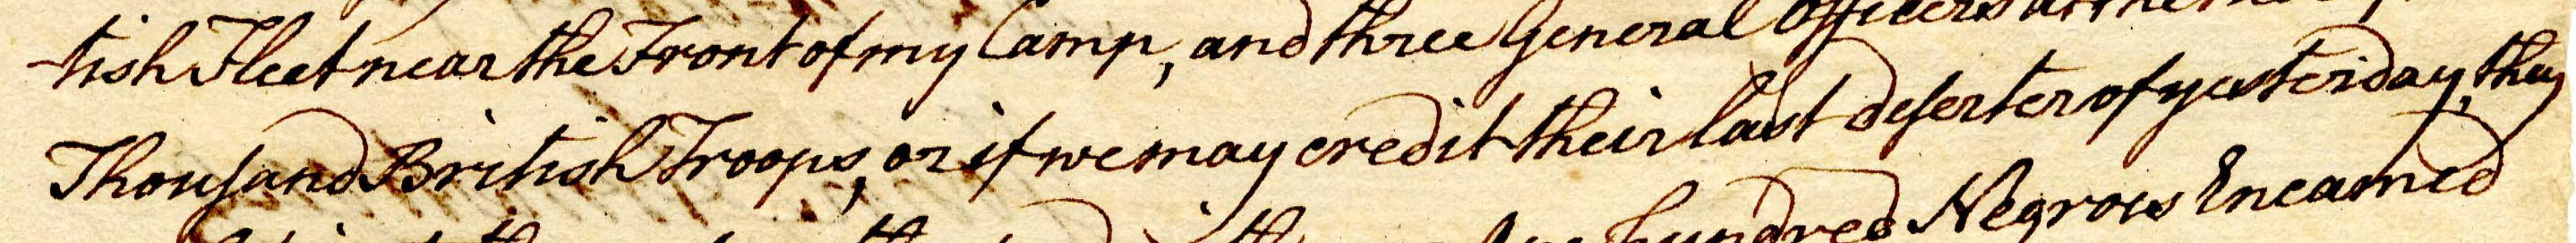Thousand British Troops, or if we may credit their last deserter of yesterday, they
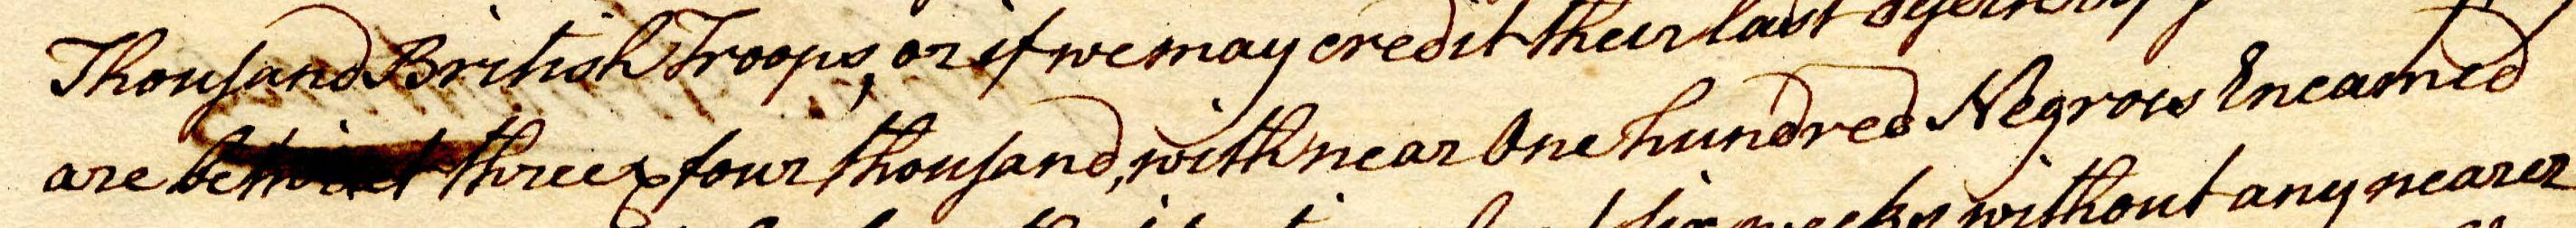are [{betwixt}] three & four thousand with near one hundred Negroes Encamed
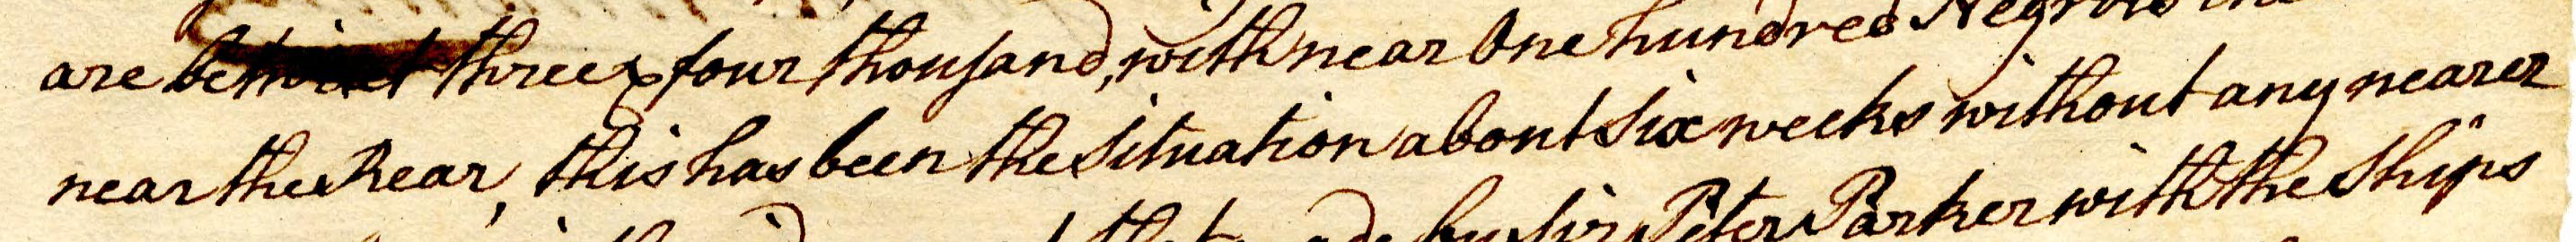near the Rear, this has been the situation about six weeks without any nearer
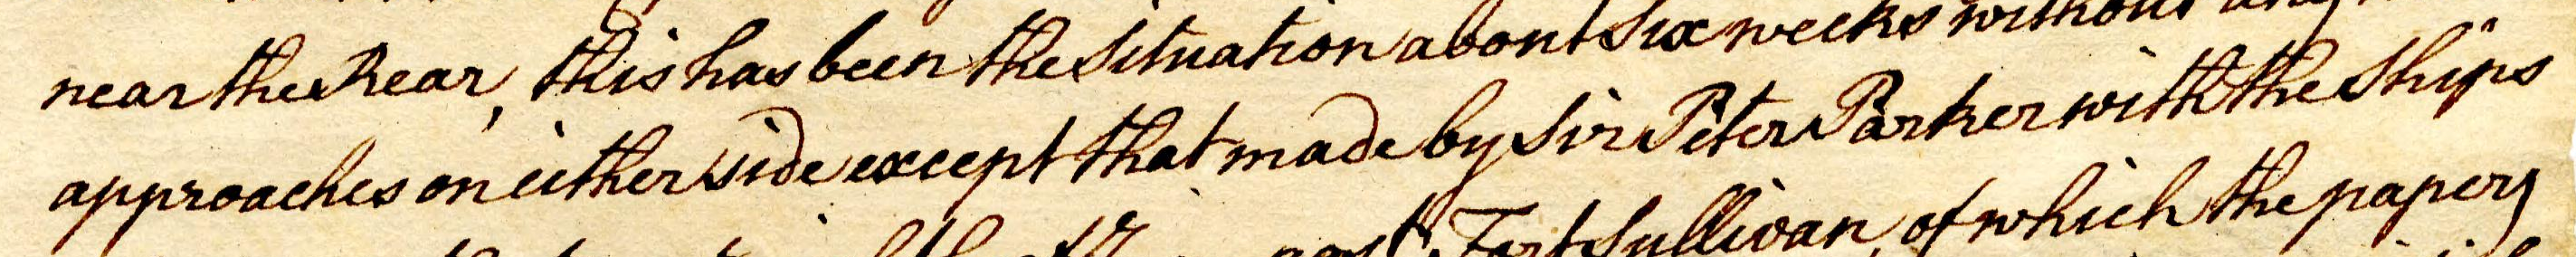approaches on either side except that made by Sir Peter Parker with the Ships
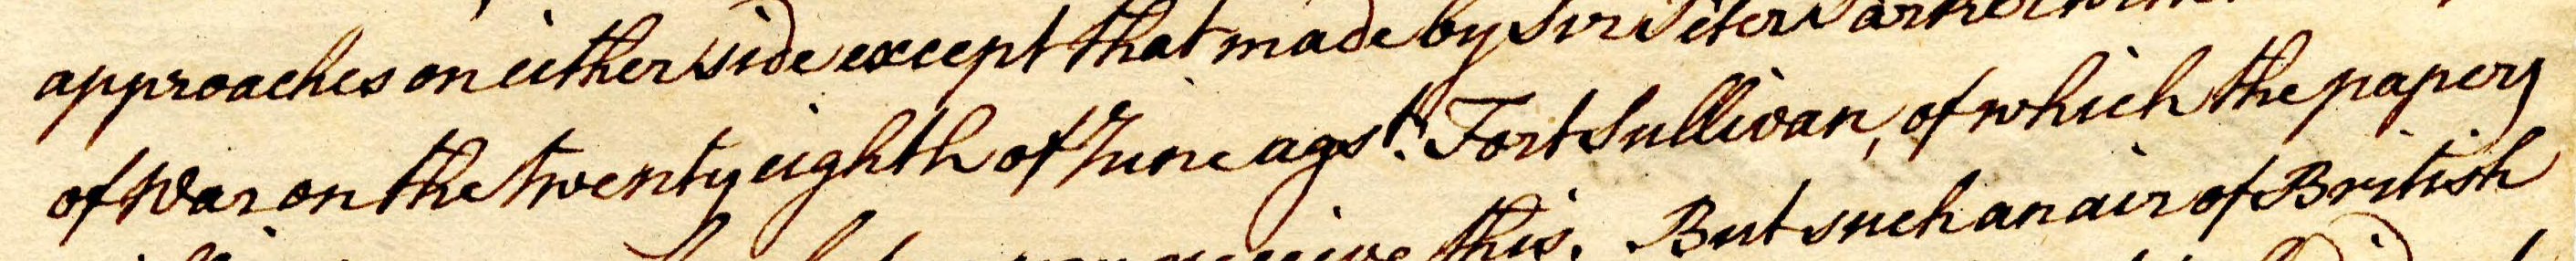of war on the twenty eighth of June ags^t. Fort Sullivan, of which the papers
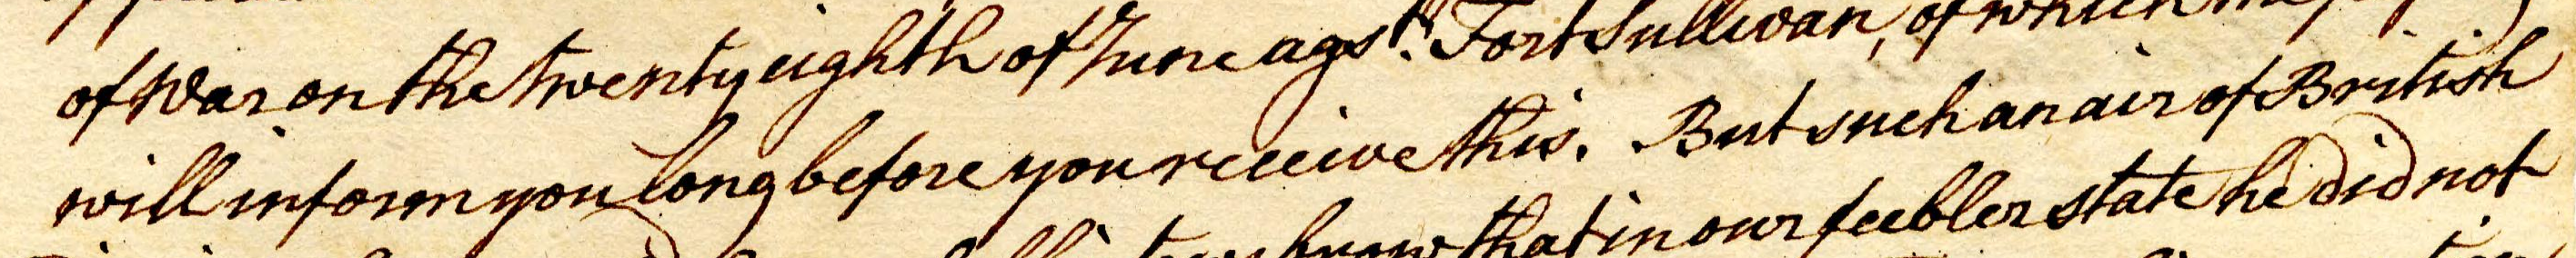will inform you long before you receive this. But such an air of British
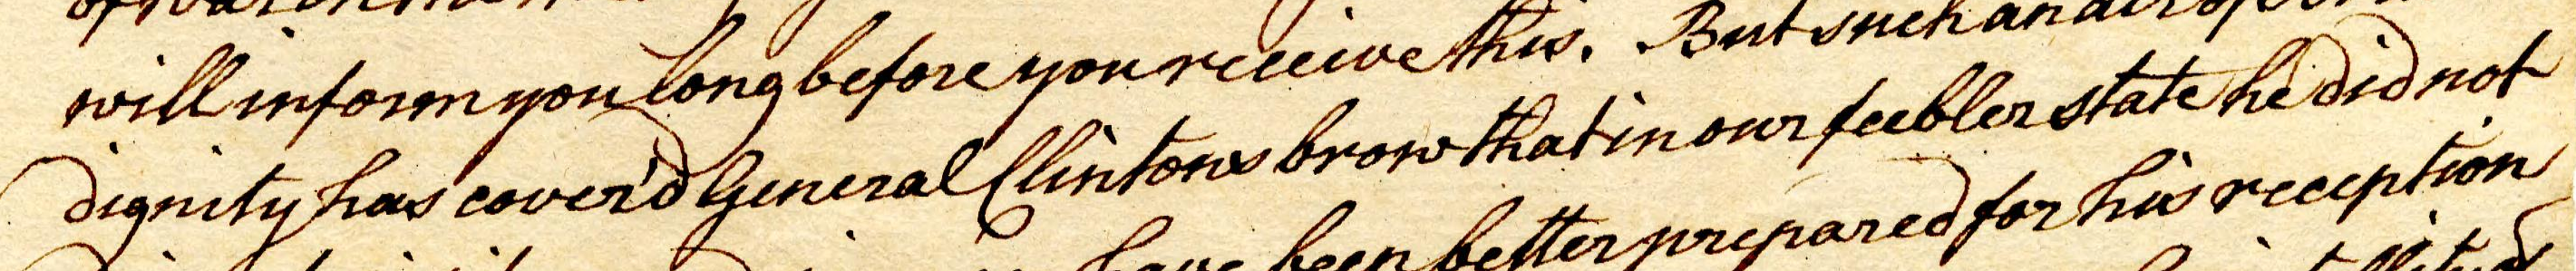dignity has cover'd General Clintons brow that in our feebler state he did not
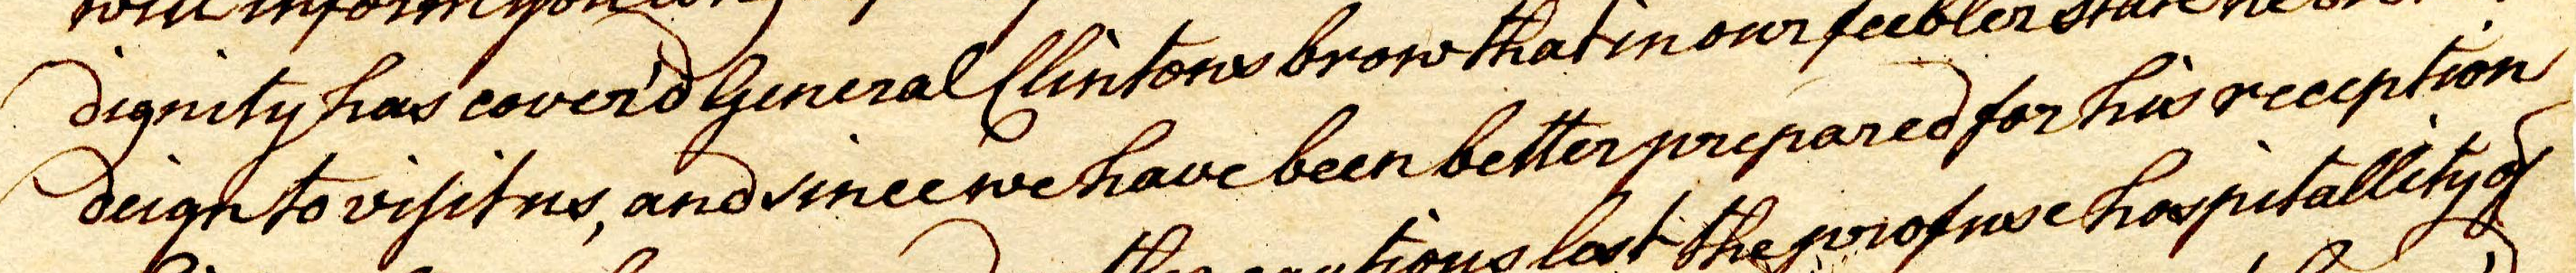deign to visit us, and since we have been better prepared for his reception
